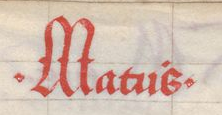.Matuṡ.
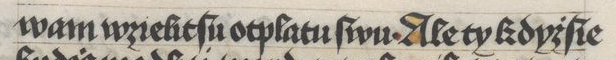wam wzielitſu otplatu ſwu.Ale ty kdyżſie
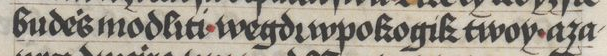budeṡ modliti.wegdi wpokogik twoy.aza¬
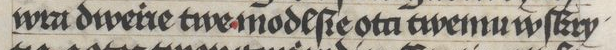wra dweṙie twe.modl ſie otci twemú wſkry¬
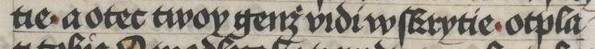tie.a otec twoy genż vidí wſkrytie.otpla¬
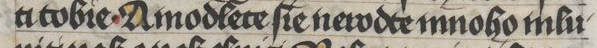ti tobie.A modlece ſie nerodte mnoho mlu¬
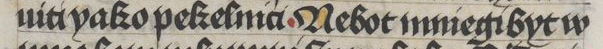uiti yako pekelnici.Nebot mníegí byt w
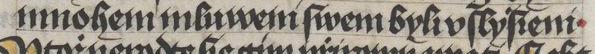mnohem mluwení ſwem byli vſlyẛiení.
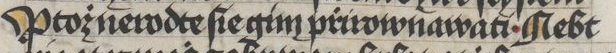Ꝓtoż nerodte ſie gim pṙirownawati.Nebt
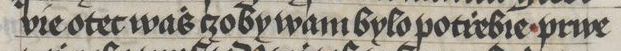víe otec vaṡ czoby wam bylo potṙebie.prwe¬
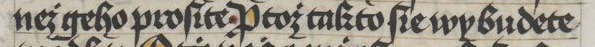neż geho proſite.Ꝓtoż takto ſie wy budete
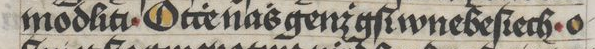modliti.Otċe naṡ genż gſi wnebeſiech.o¬
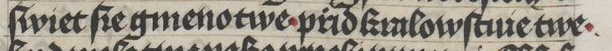ſwiet ſie gmeno twe.pṙid kralowſtuie twe.
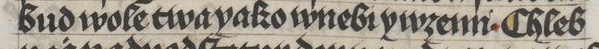bud wole twa yako wnebi y wzemi.Chleb
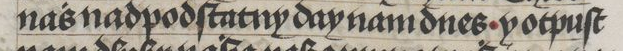naṡ nadpodſtatny day nam dnes.y otpuſt
